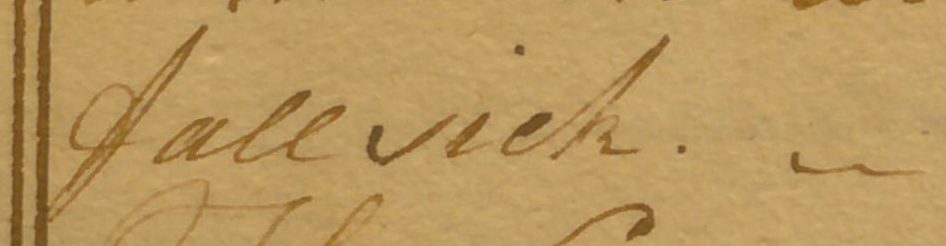fall sick.-
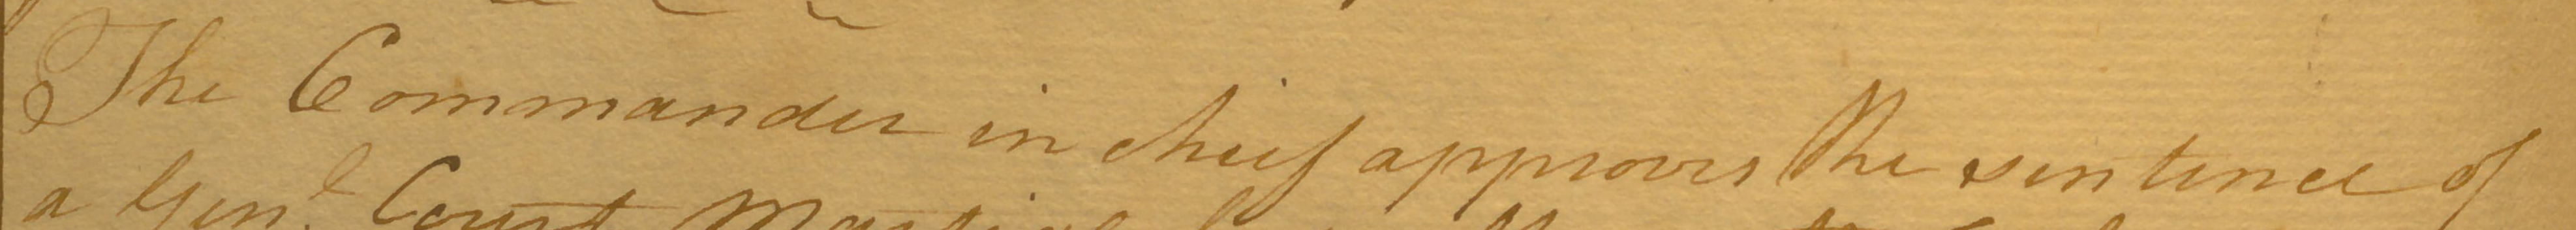The Commander in chief approves the sentence of
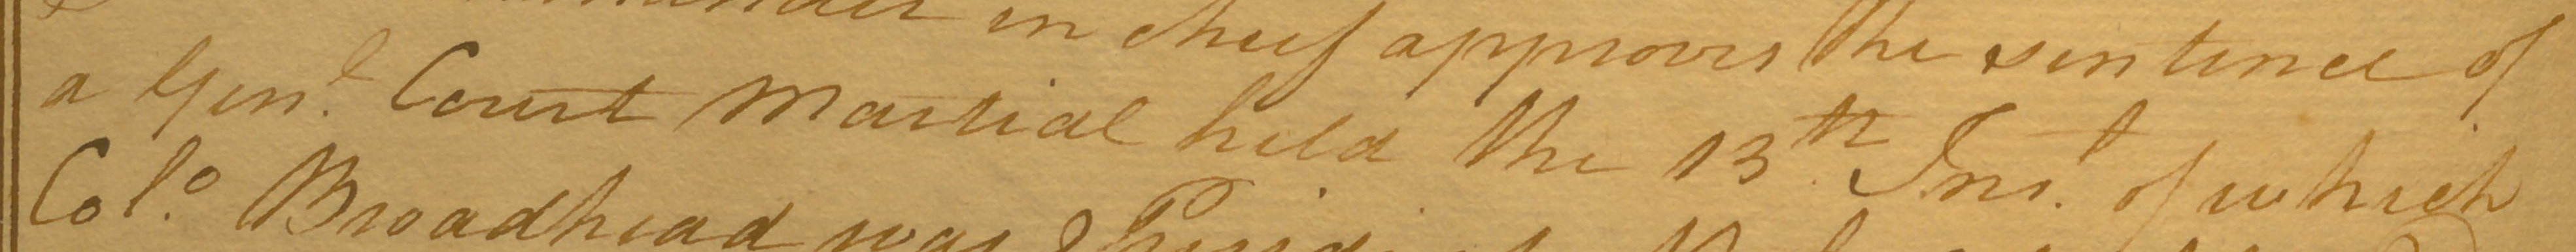a Gen^l. Court martial held the 13^th. Ins^t. of which
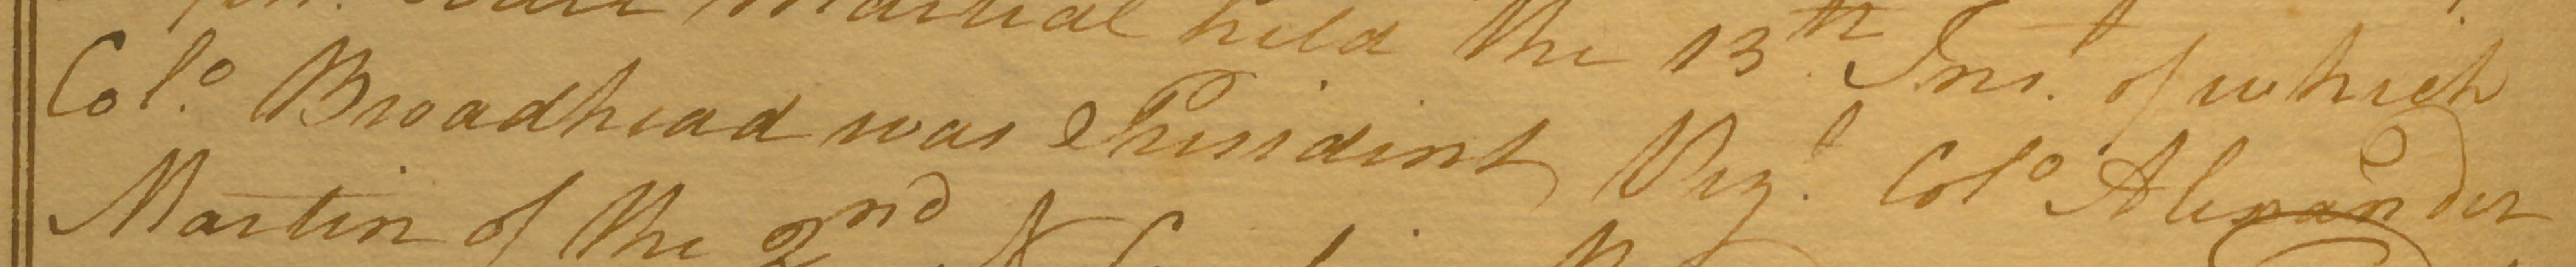Col^o. Broadhead was President Viz^t. Col^o Alexander
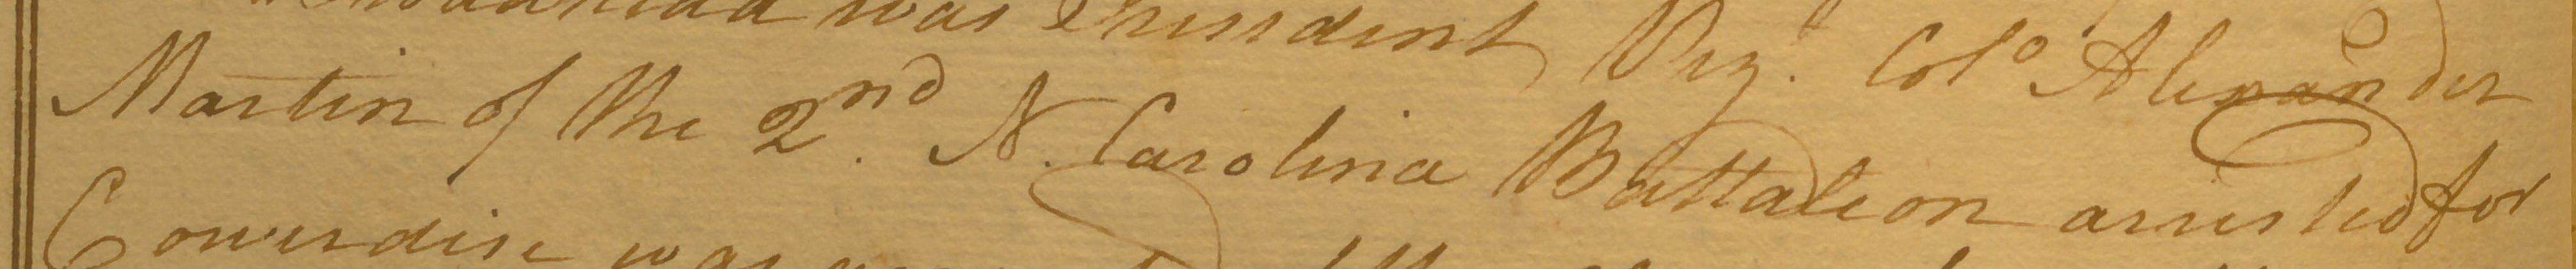Martin of the 2^nd. N. Carolina Battalion arrested for
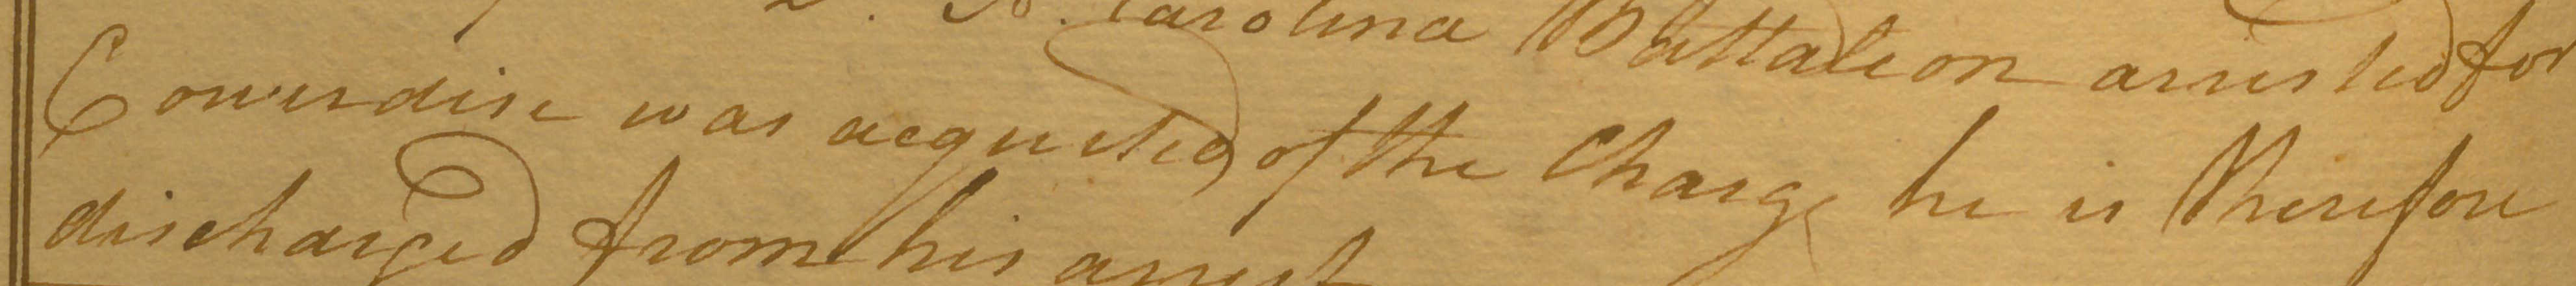Cowardise was acquited of the Charge he is therefore
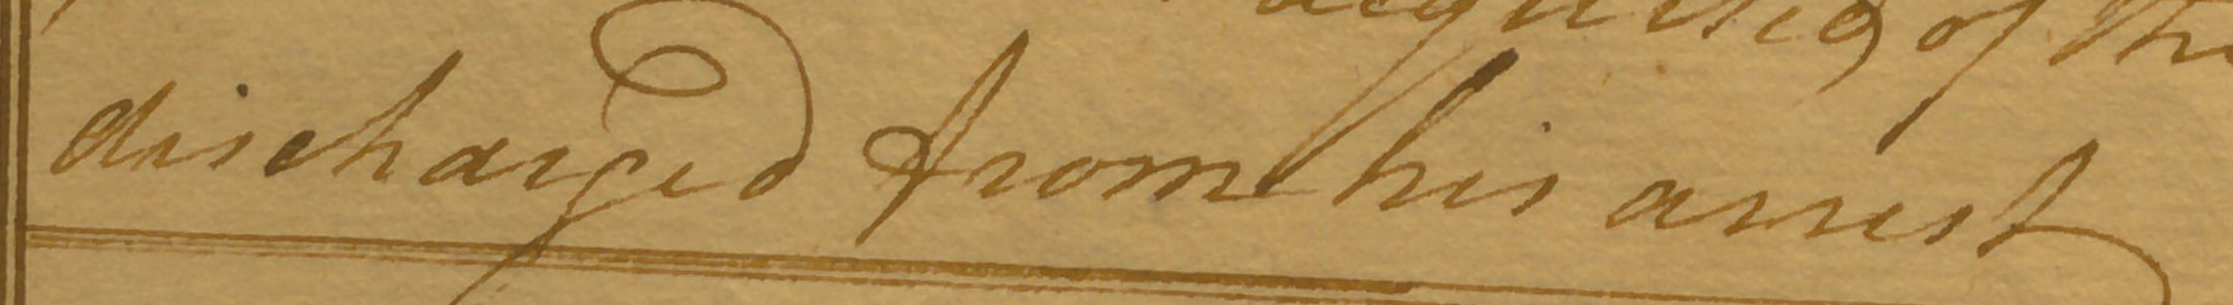discharged from his arrest
